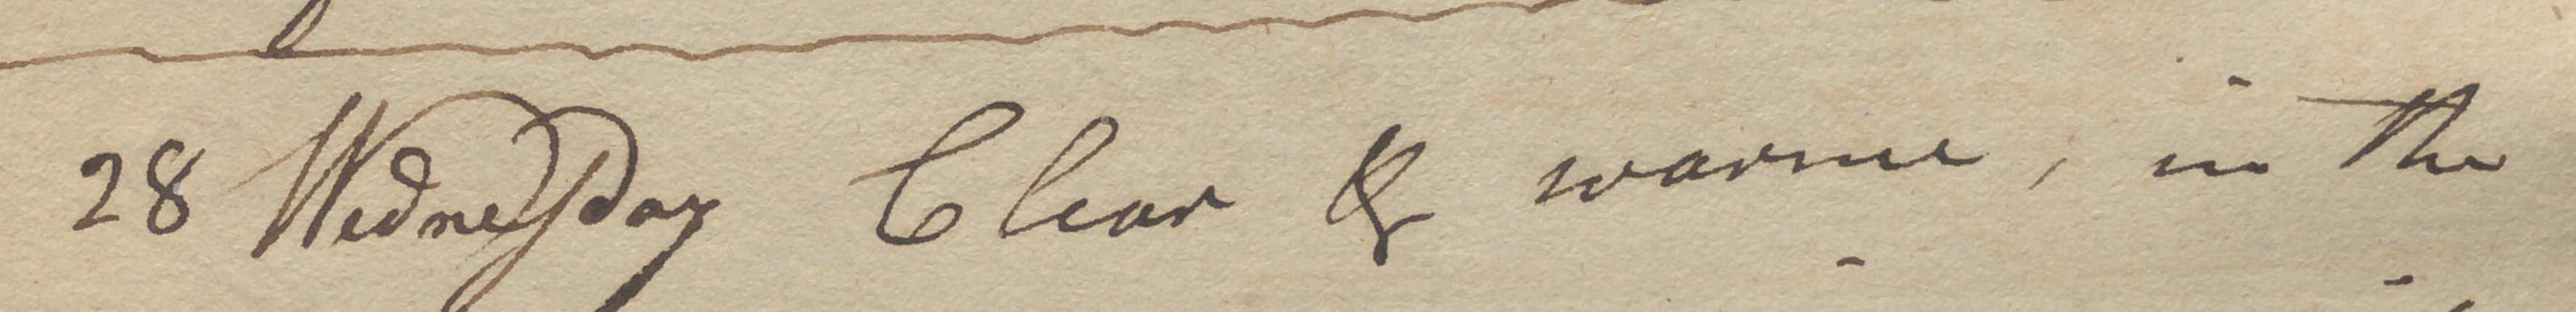28 Wednesday Clear & warme, in the
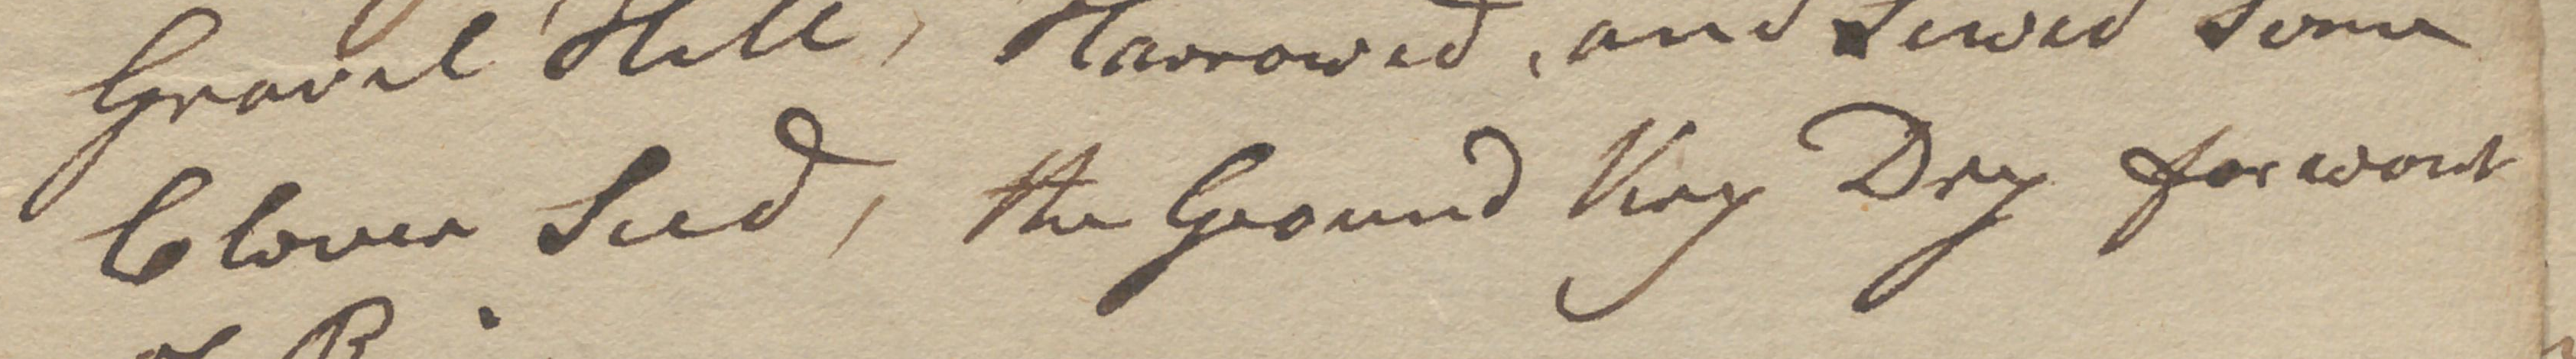Clover seed, the Ground hay Dry for want
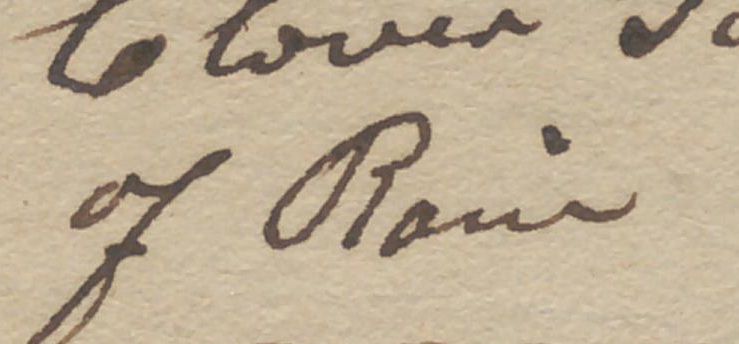of Rain
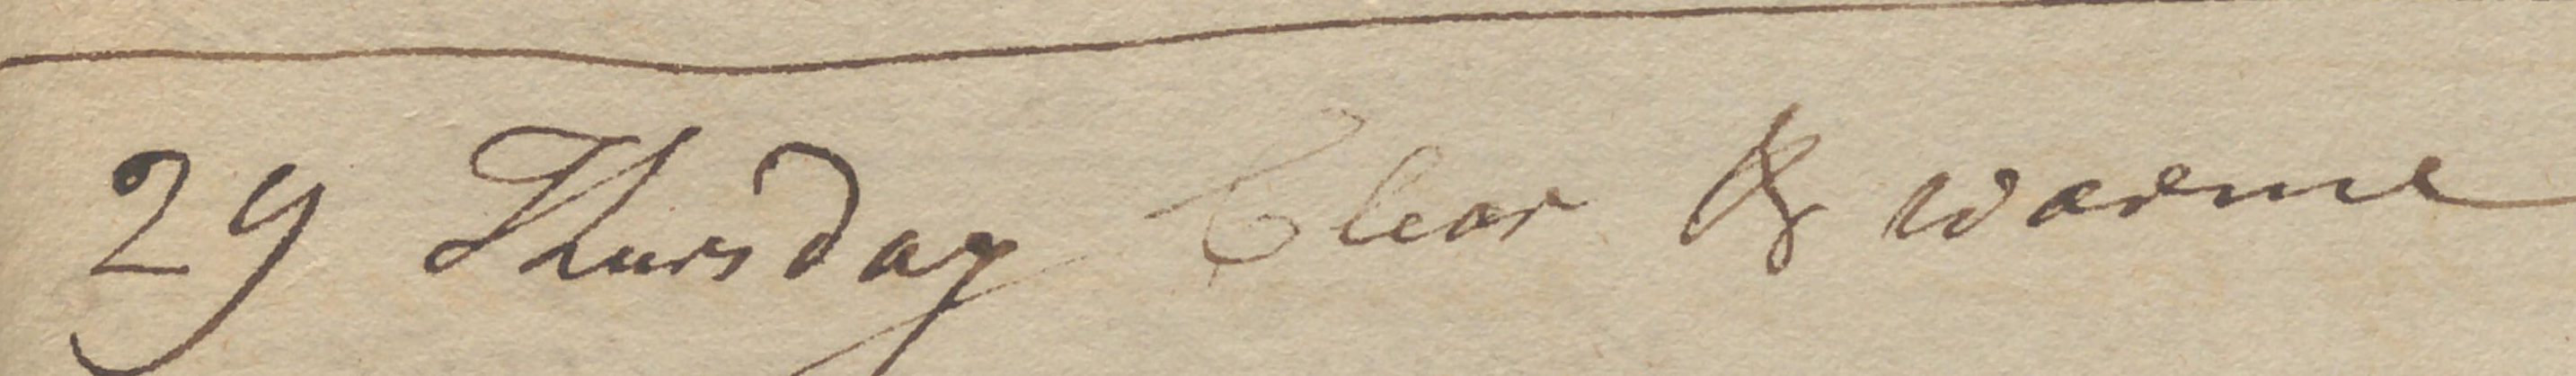29 Thursday Clear & warme
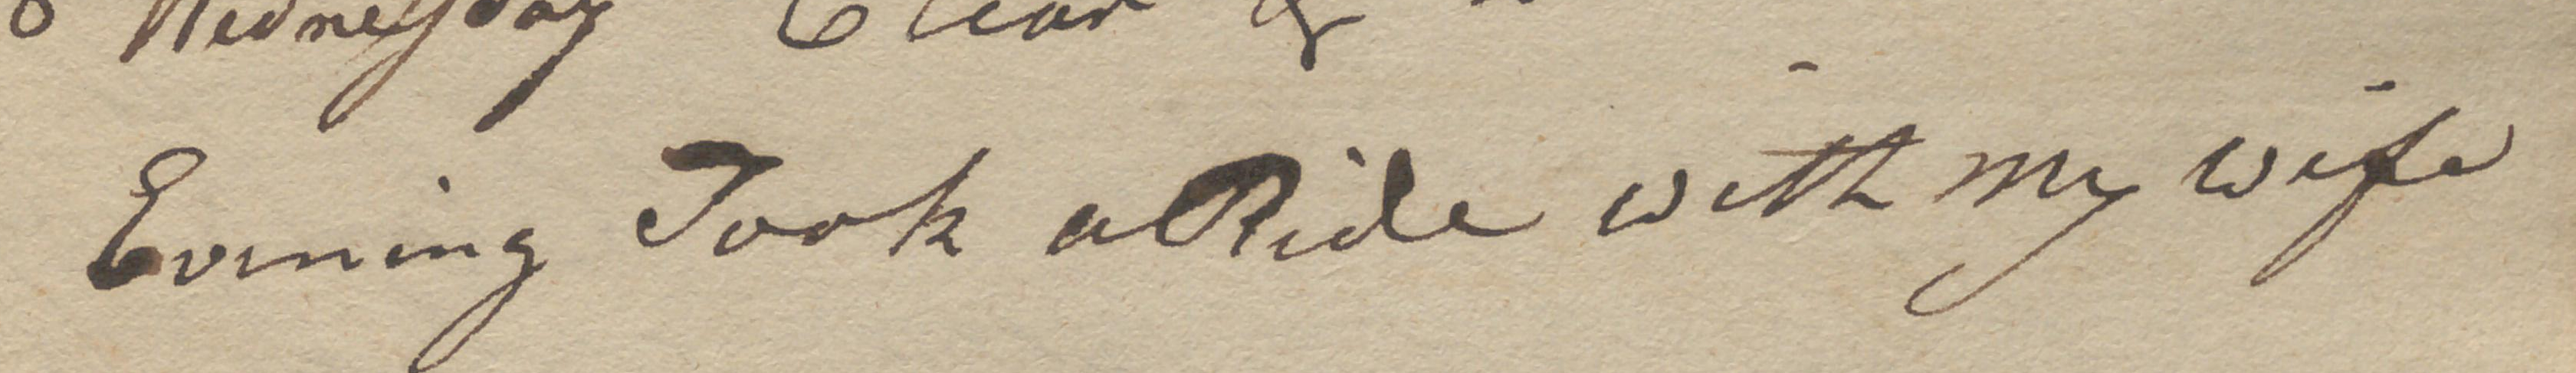Evening Took a Ride with my wife
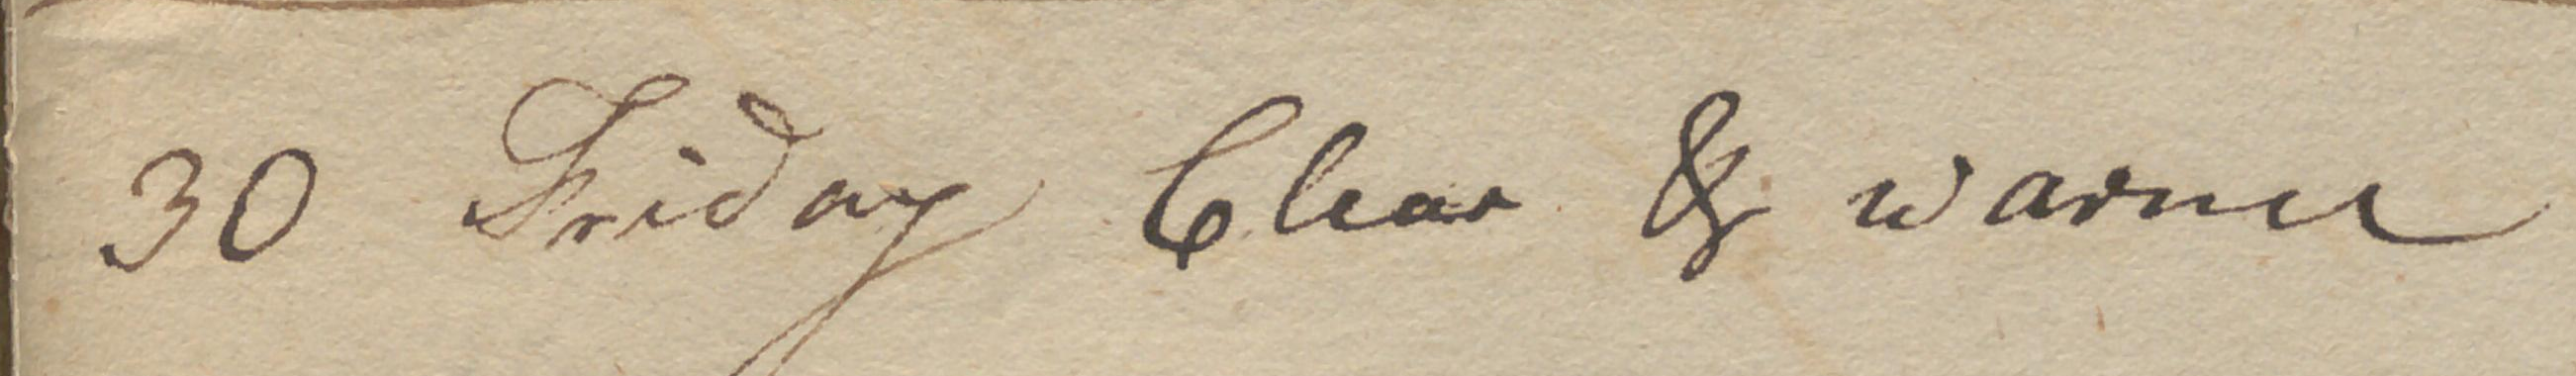30 Friday Clear & warne
